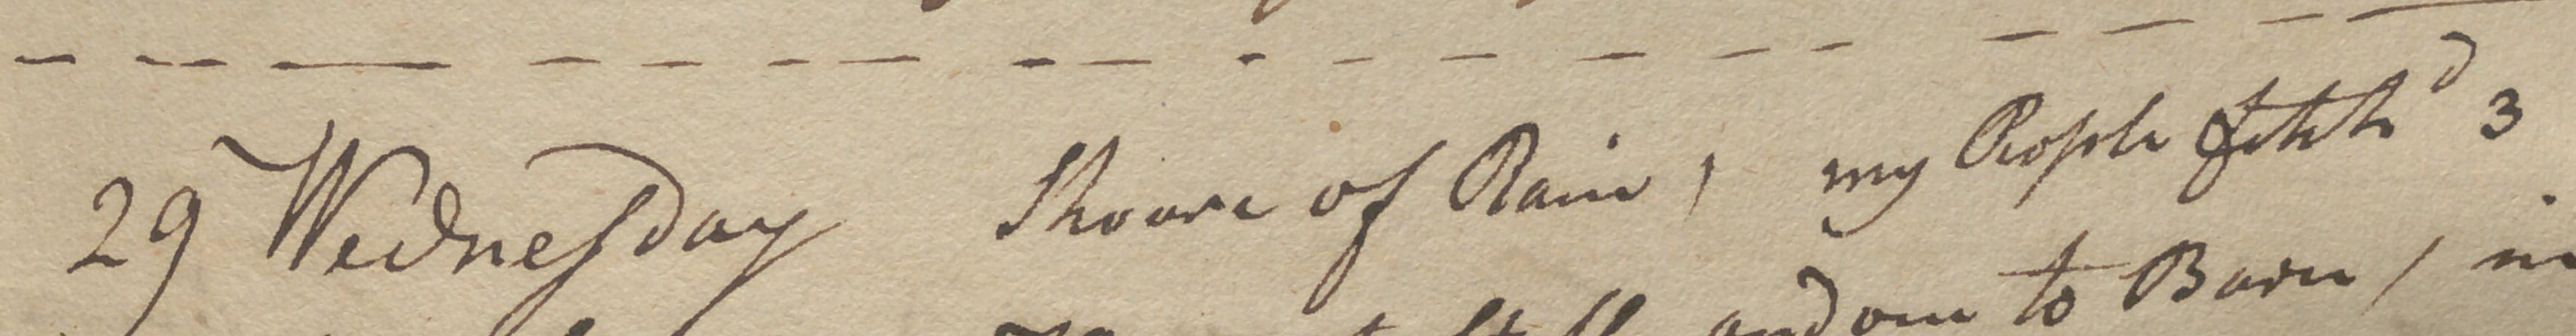29 Wednesday Shoure of Rain, my Peoph fetch^d 3
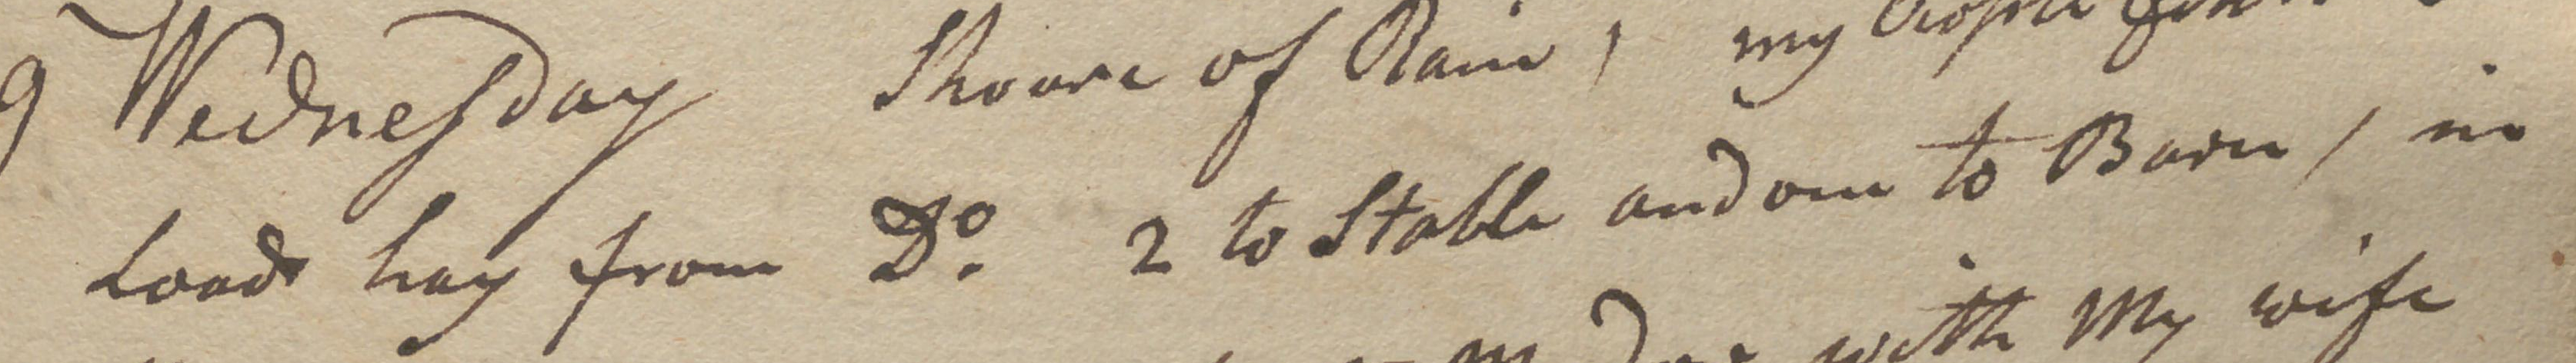Loads hay from D^o. 2 to Stable and one to Barn, in
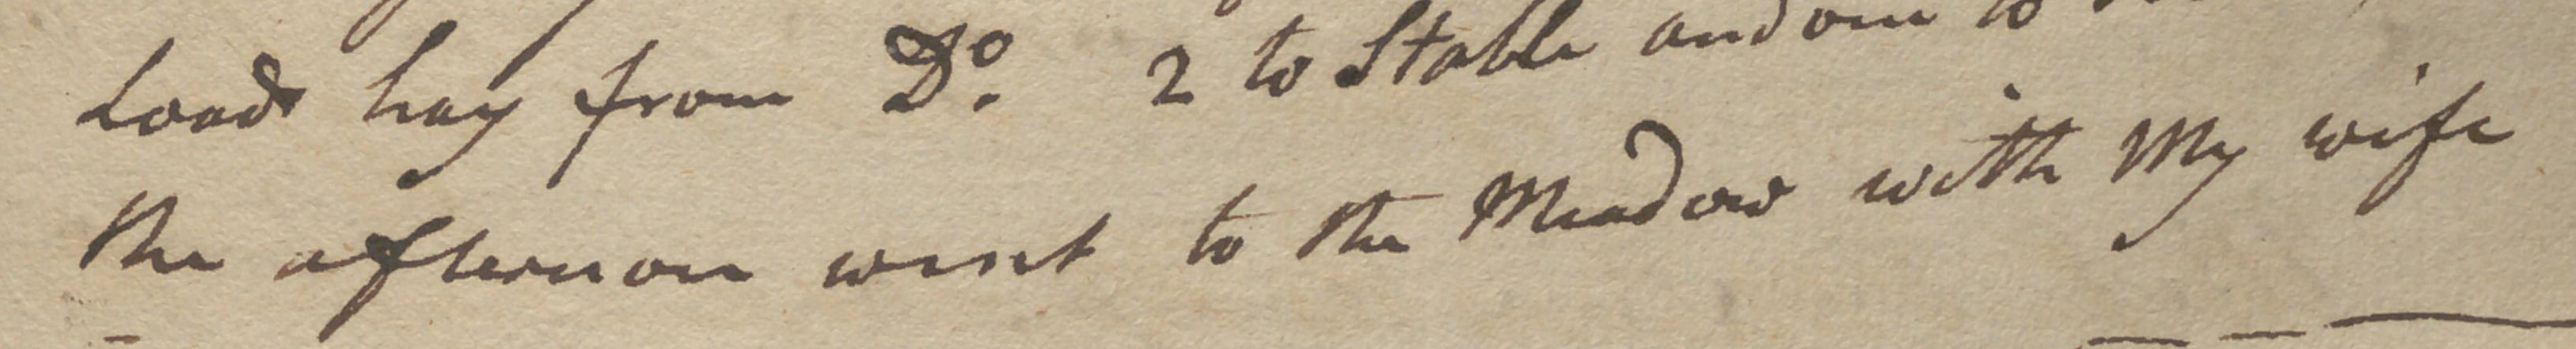the afternoon went to the Meadow with my wife
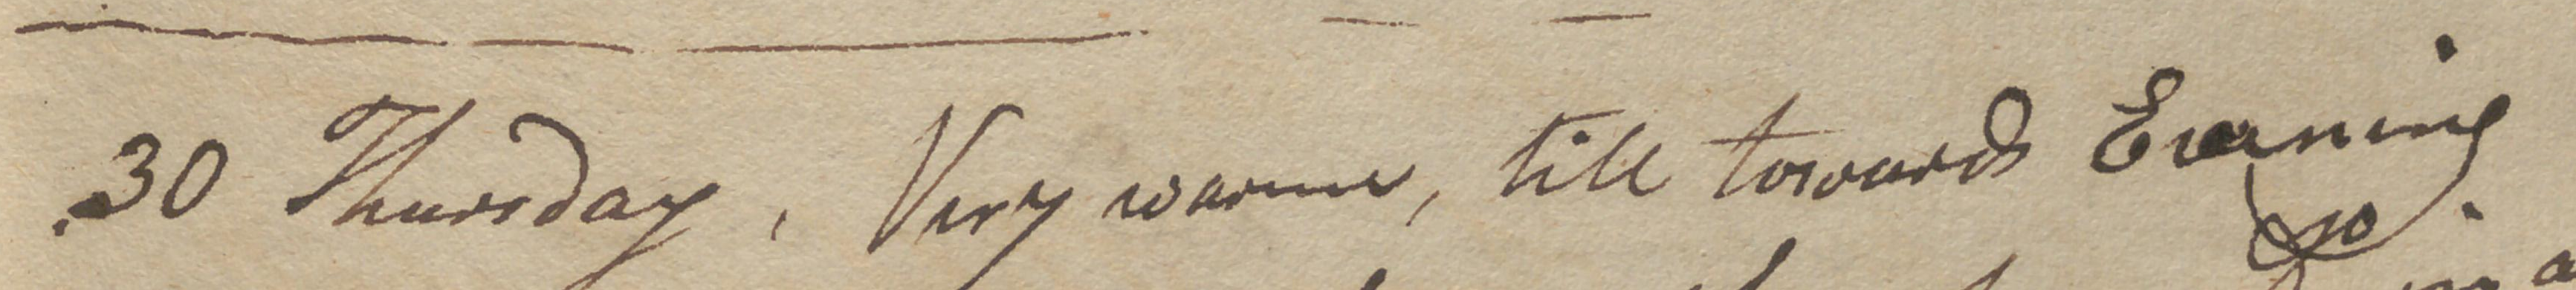30 Thursday. Very warme, till towards Evening
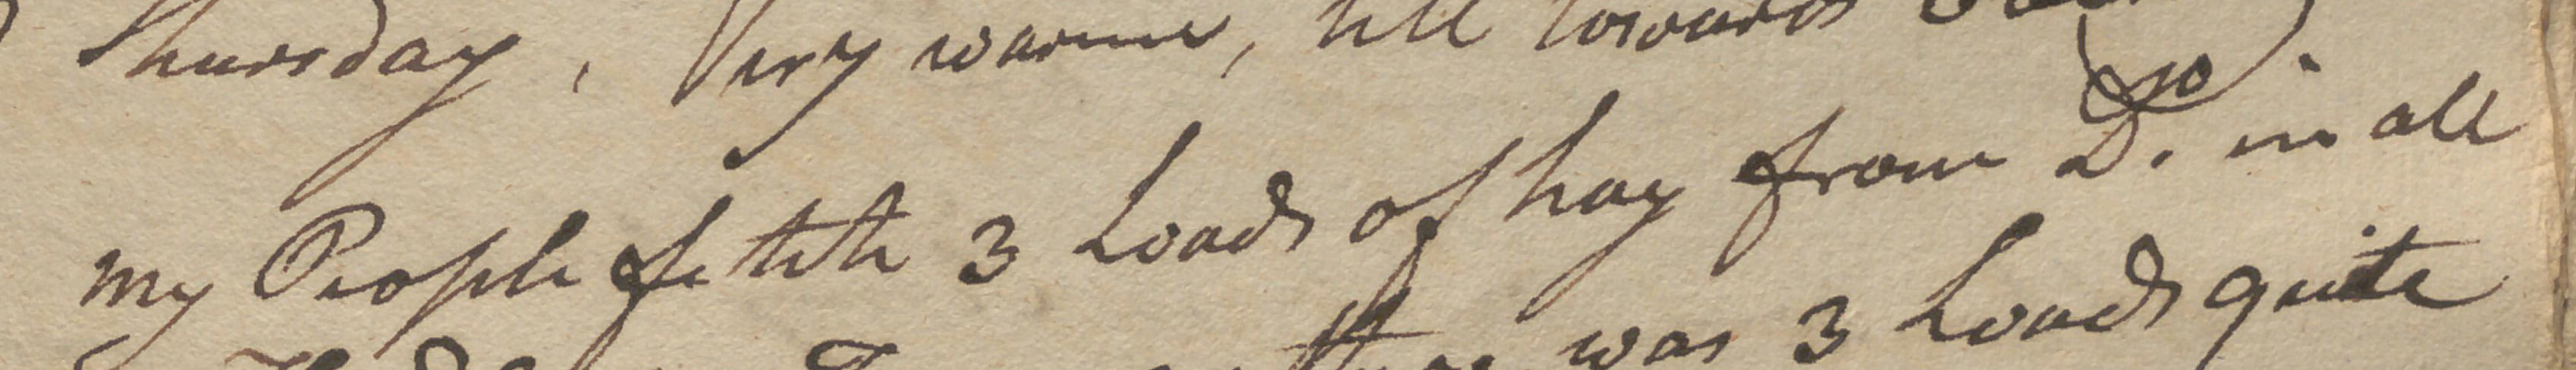my People fetch 3 Loads of hay from D^o. in all
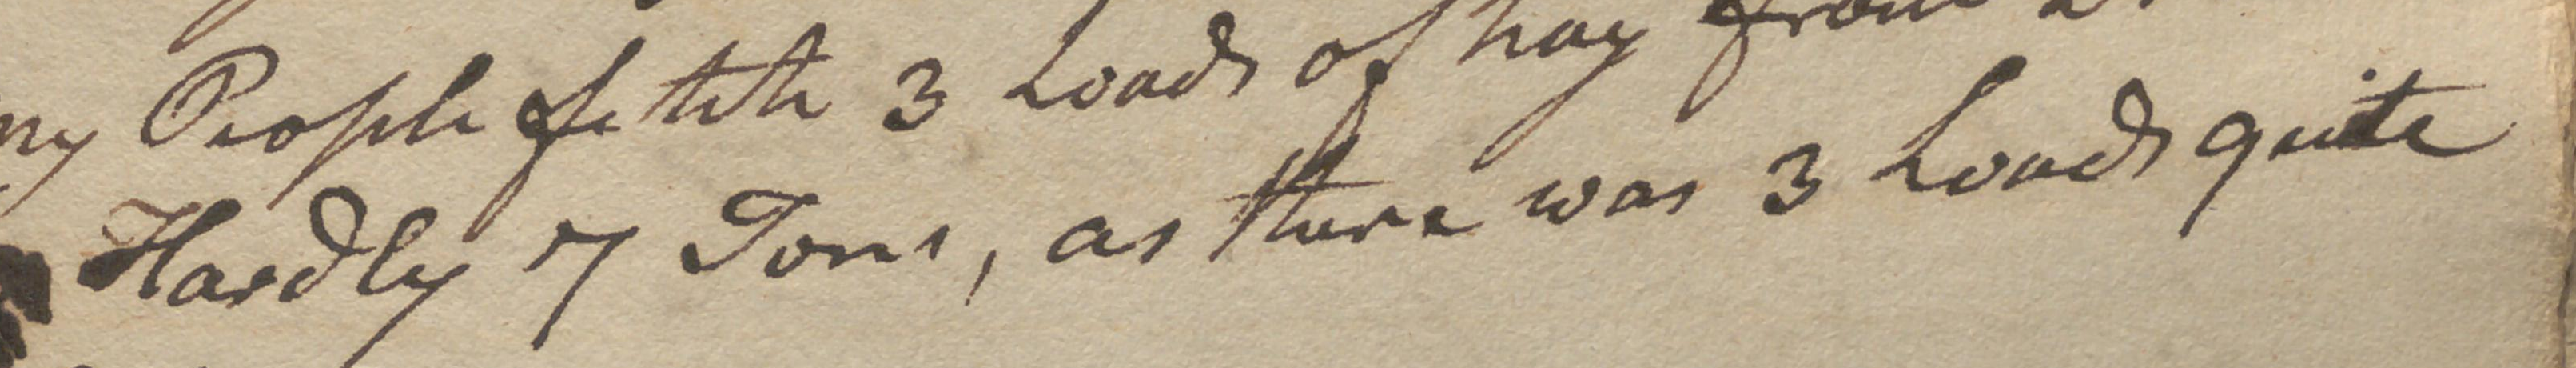Hardly 7 Tons, as there was 3 Loads quite
